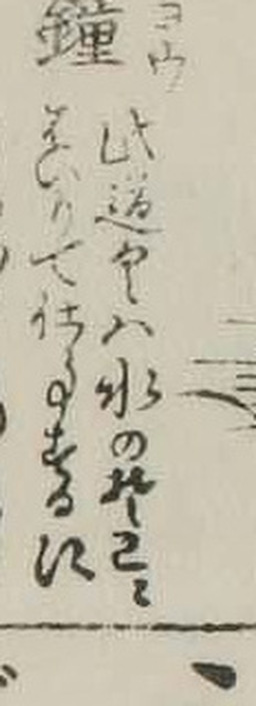此道具は水のそこに
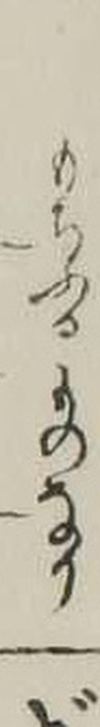もちふるものなり
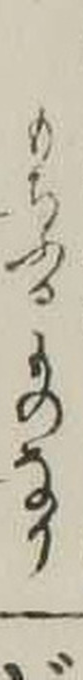もちふるものなり
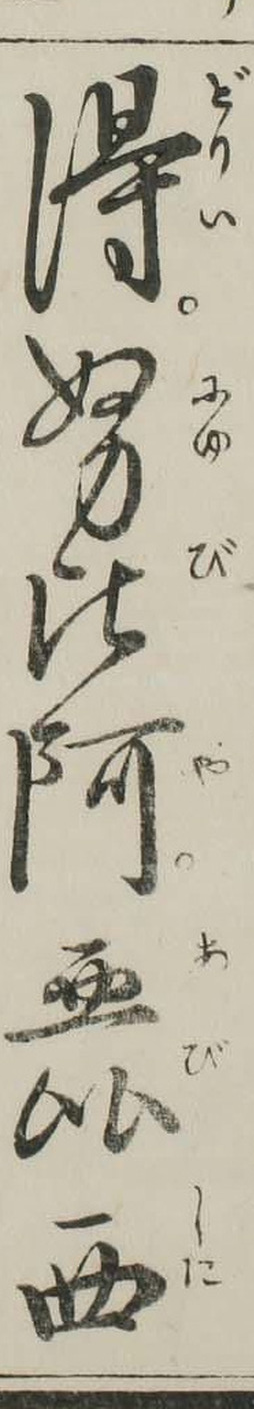得。努比阿。亜比西
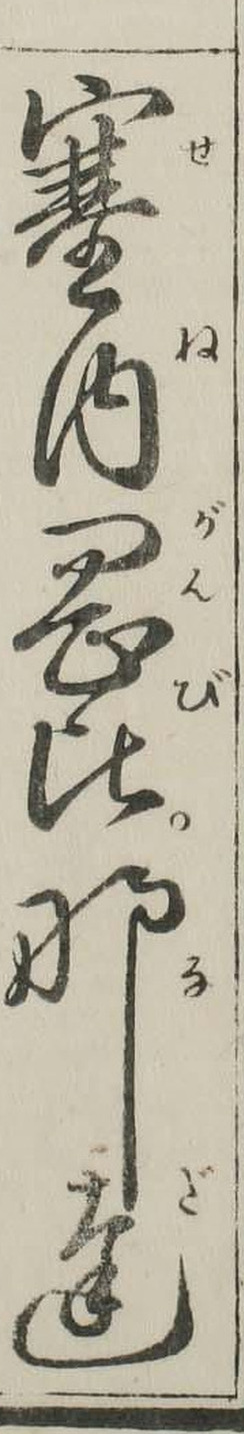塞内岡比。那達
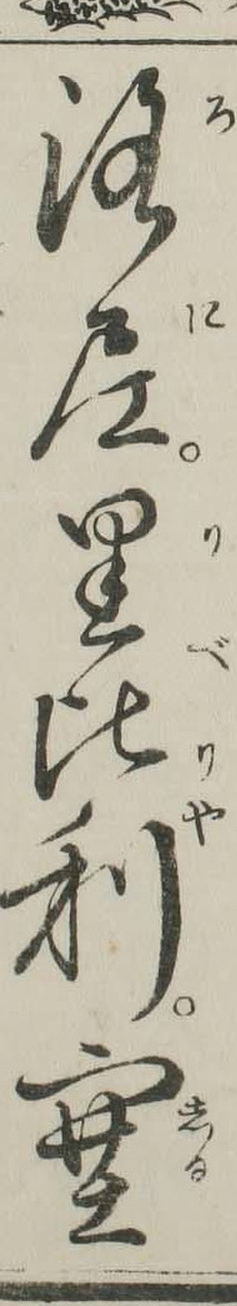路尼。里比利。塞
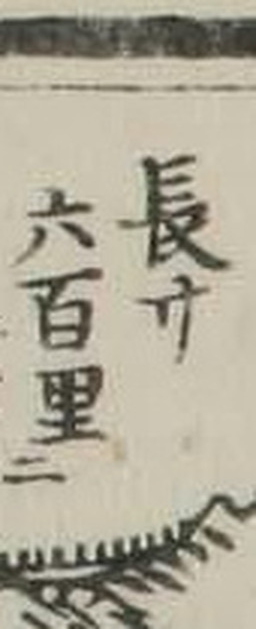六百里ニ
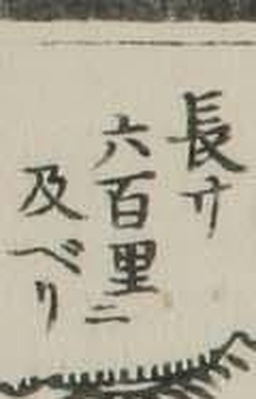六百里ニ
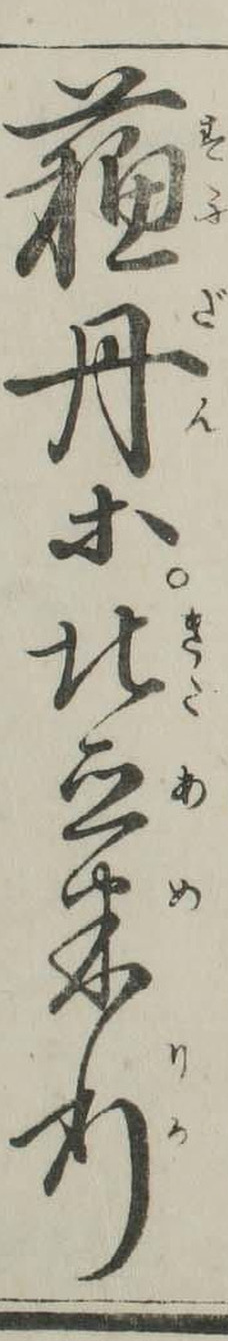蘇丹等。北亜米利

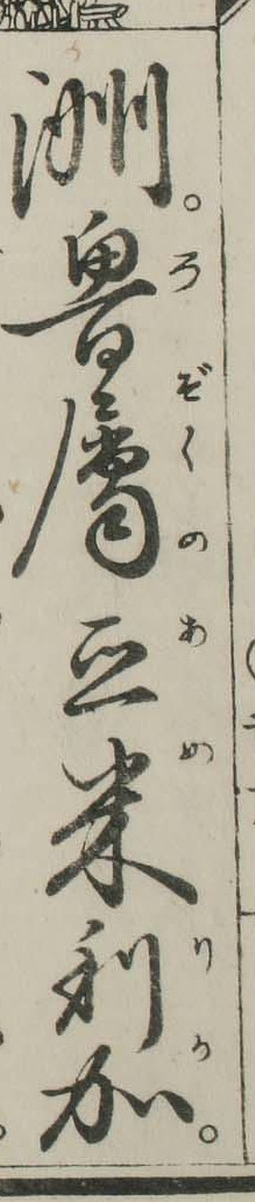洲。魯属亜米利加。
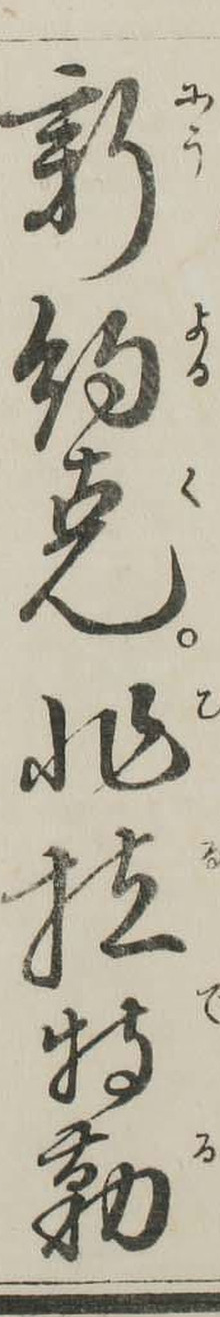新約克。非拉特勤
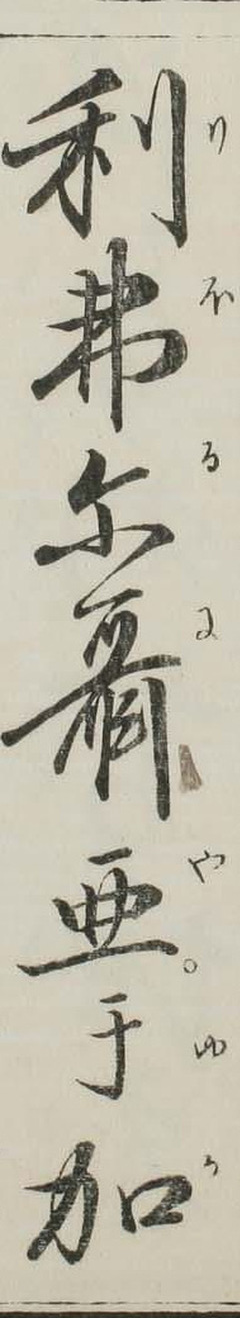利弗尓聶亜。于加
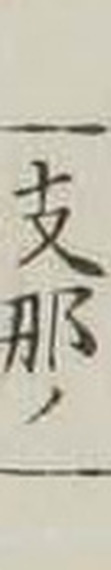支那ノ
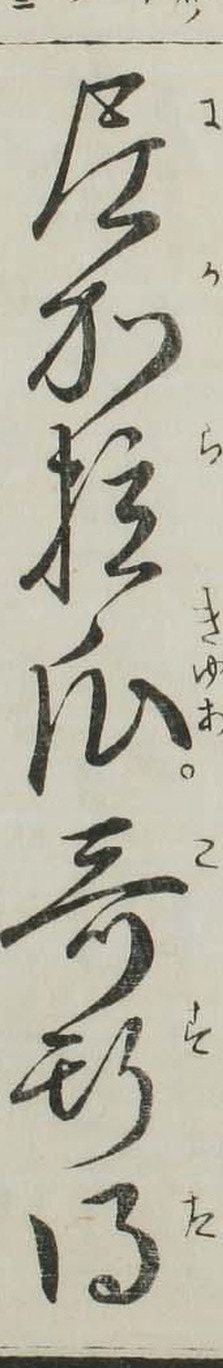尼加拉瓜。哥斯得
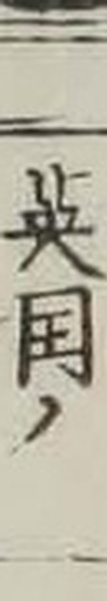英国ノ
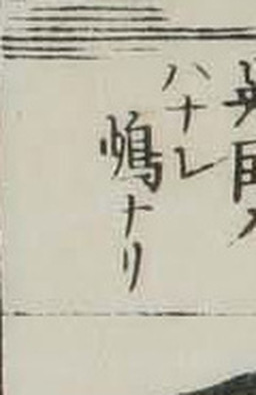嶋ナリ
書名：開化往来
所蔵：東京学芸大学教育コンテンツアーカイブ
